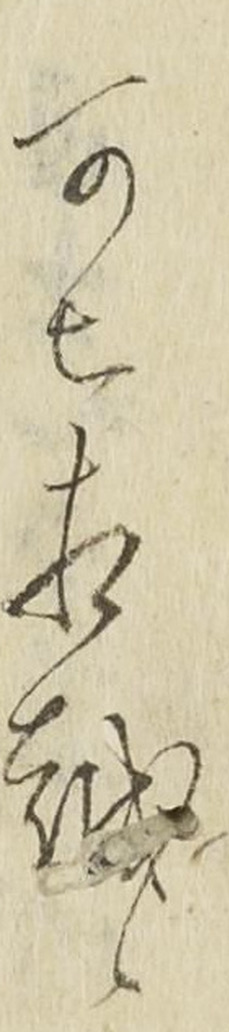可被相越候
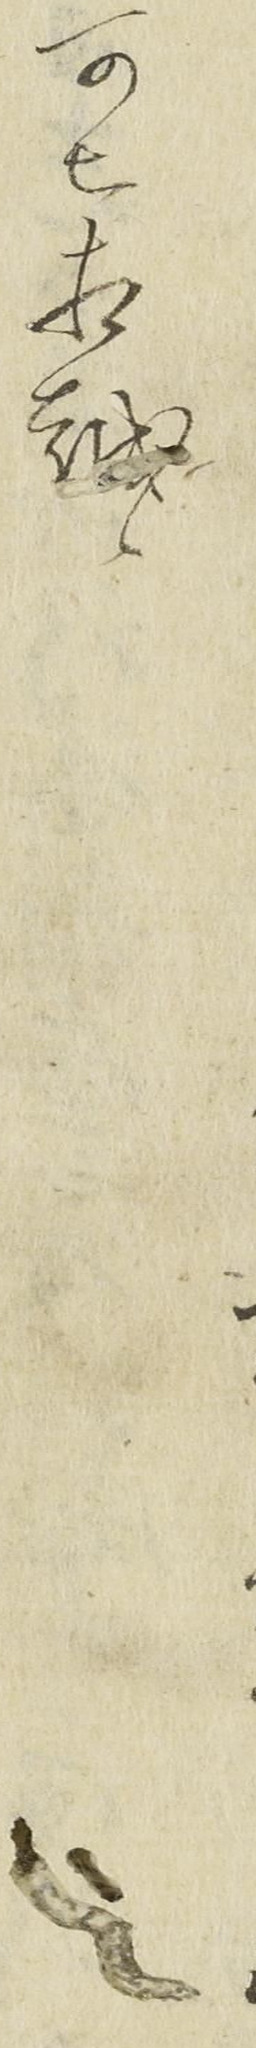可被相越候
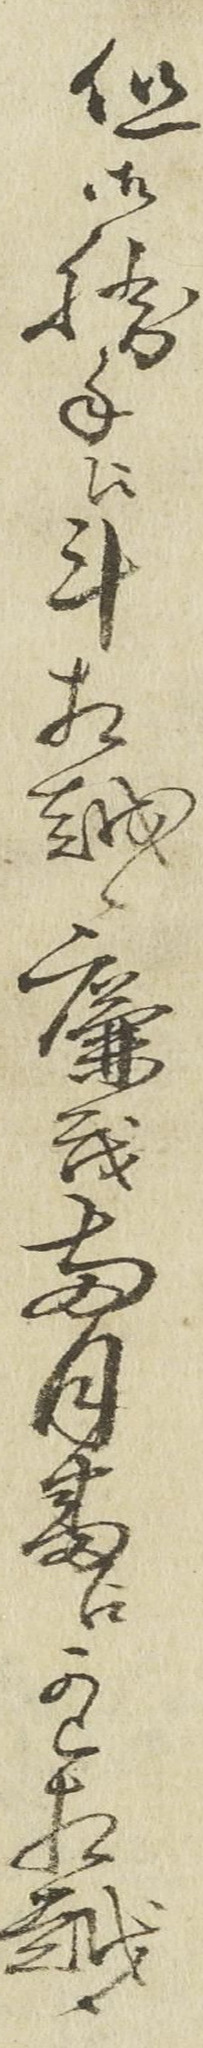但御勝手え斗相越候廉茂両月番え可被相越候
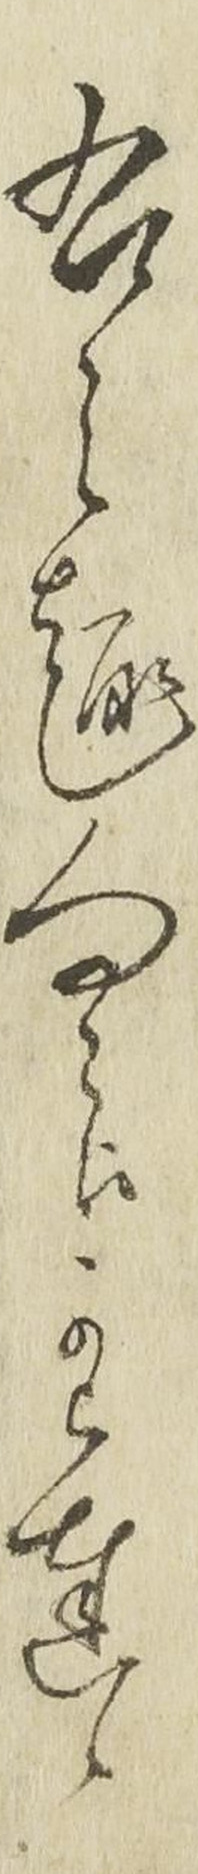右之趣向々え可被達候
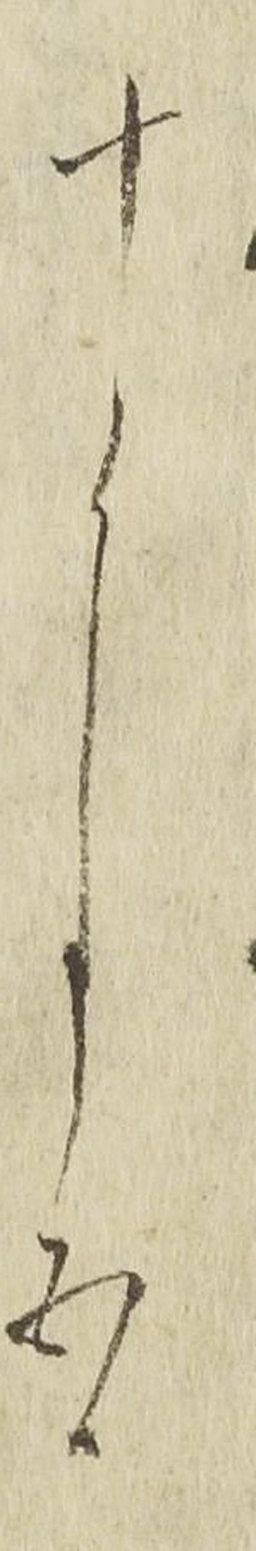十月五日
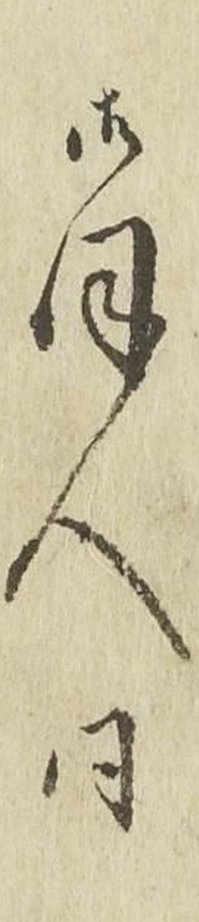御同人同
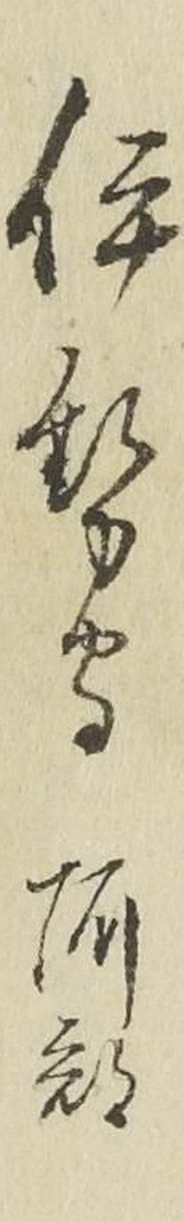伊勢守阿部
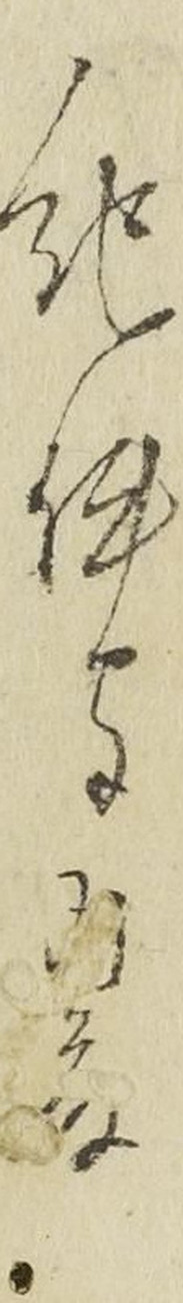紀伊守内藤
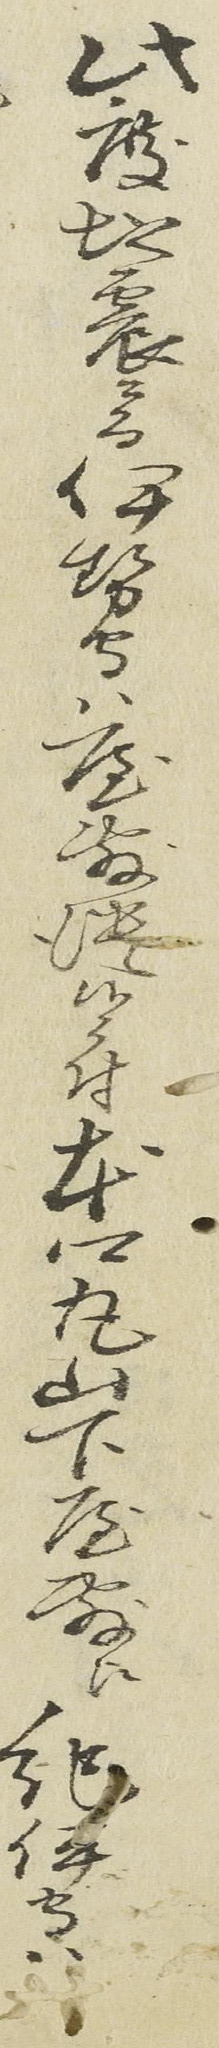今度地震に而伊勢守ハ屋敷潰候ニ付本郷丸山下屋敷え紀伊守ハ
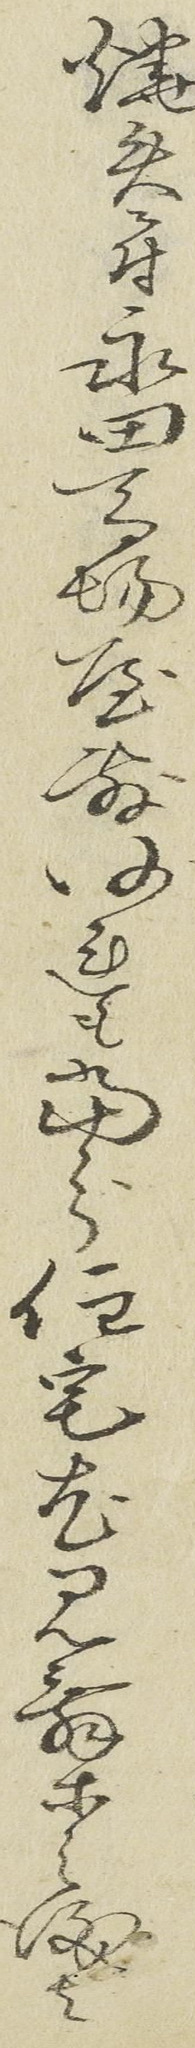焼失ニ付永田馬場屋敷何れも当分住宅尤見舞等之儀は

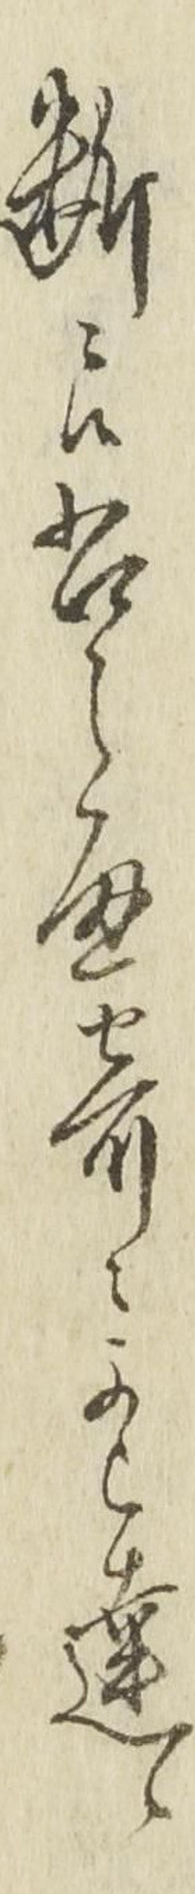断ニ候右之通寄ニ可被達候
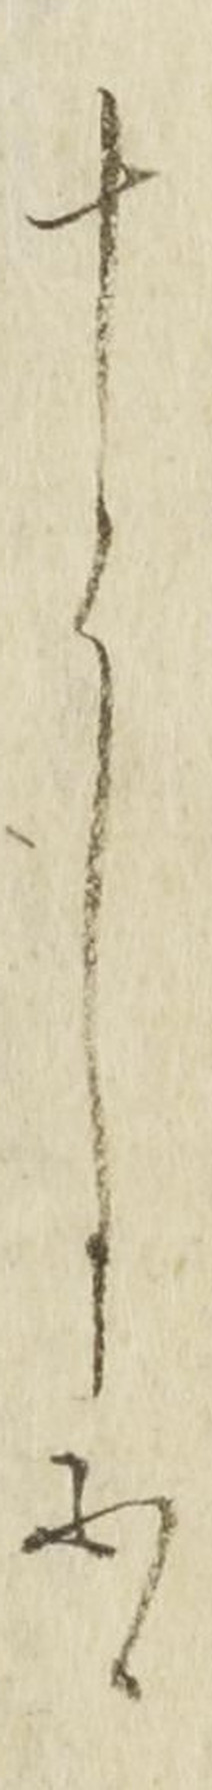十月五日
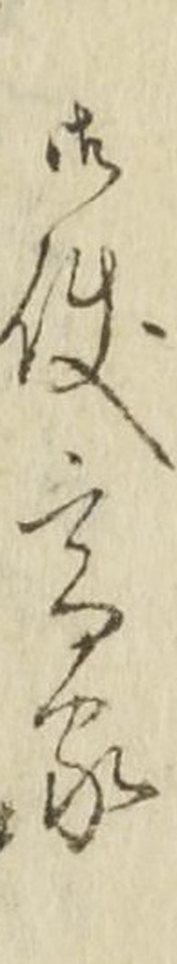御使宮家
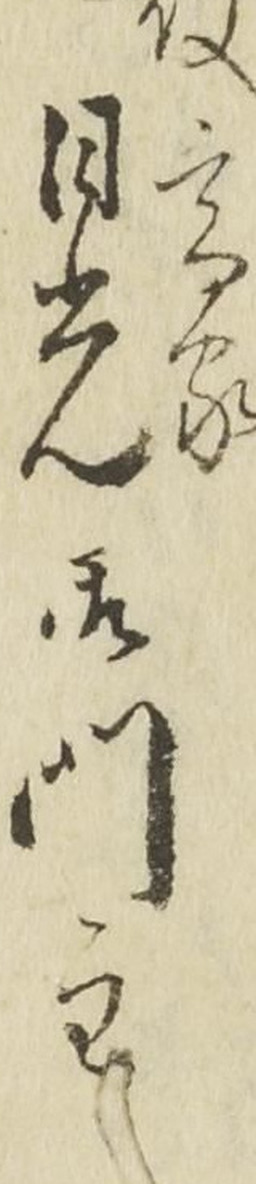日光御門主
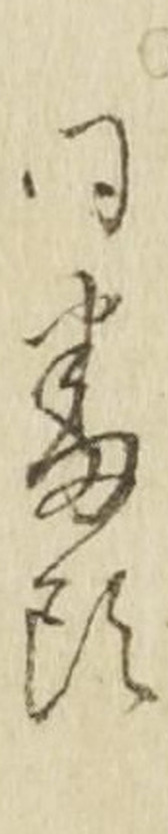同番頭
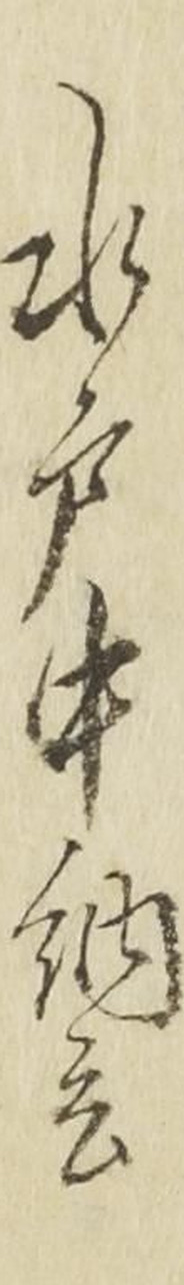水戸中納言
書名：安政二乙卯年十月二日大地震之事
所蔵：東京大学地震研究所図書室 Earthquake Research Institute Library, The University of Tokyo, JAPAN
